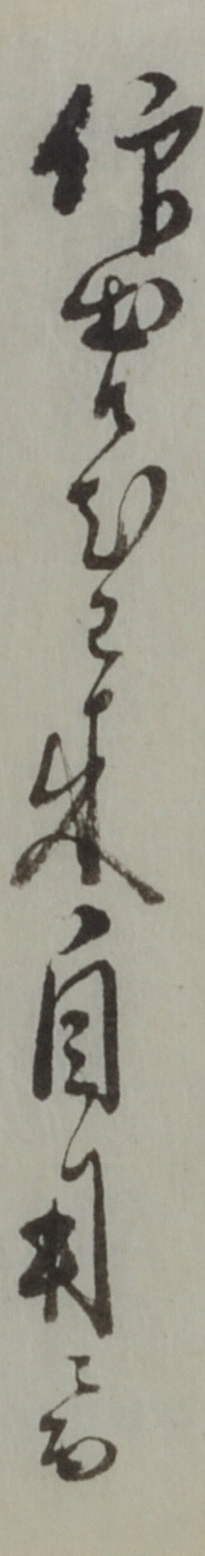仰出候尤已来自用ニ而
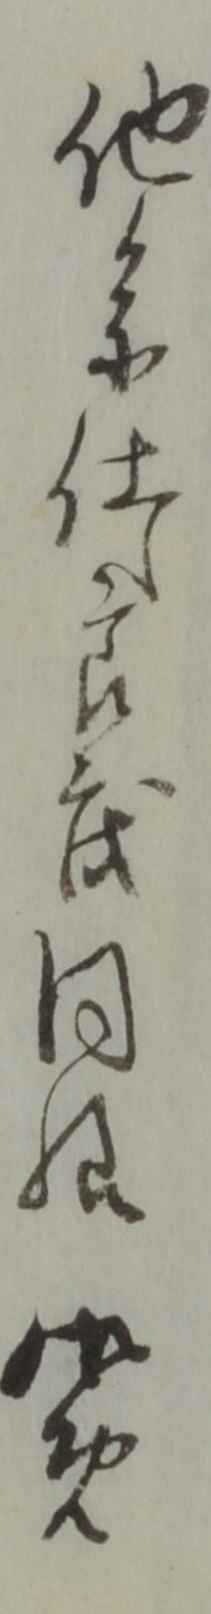他参仕候節茂同様御免
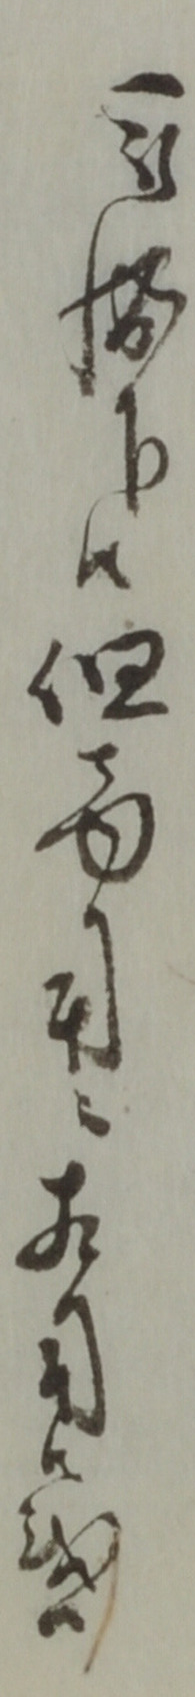被成下候但商用ニ相用候義ハ
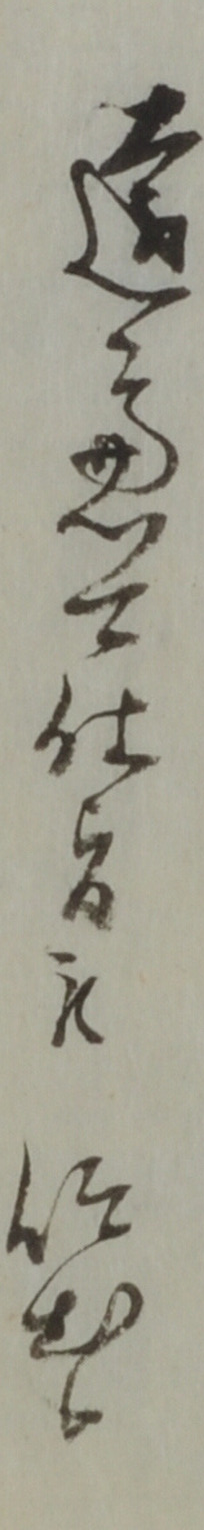遠慮可仕旨被仰出候
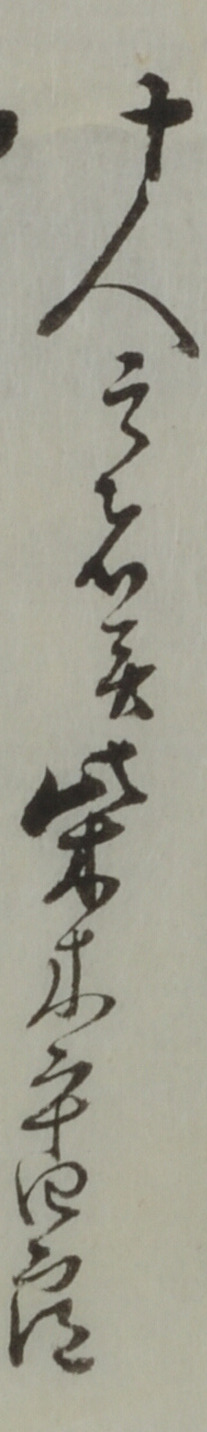十人之者并柴木平四郎
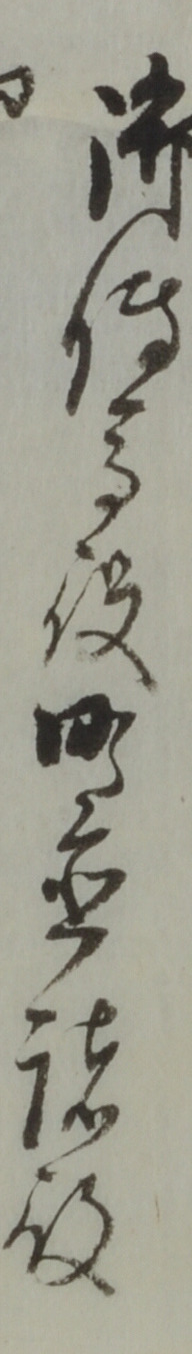御伝馬役町並諸役
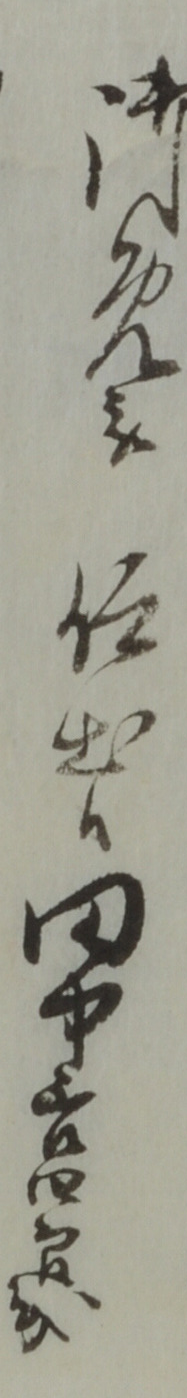御免被仰出候田中善四郎義
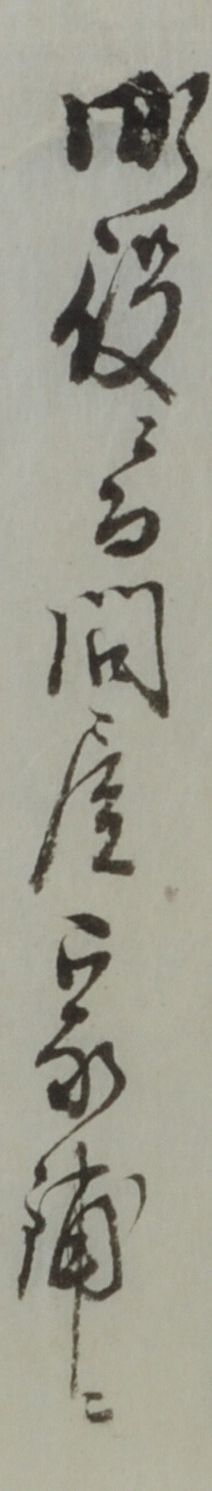町役ニ而問屋家敷ニ
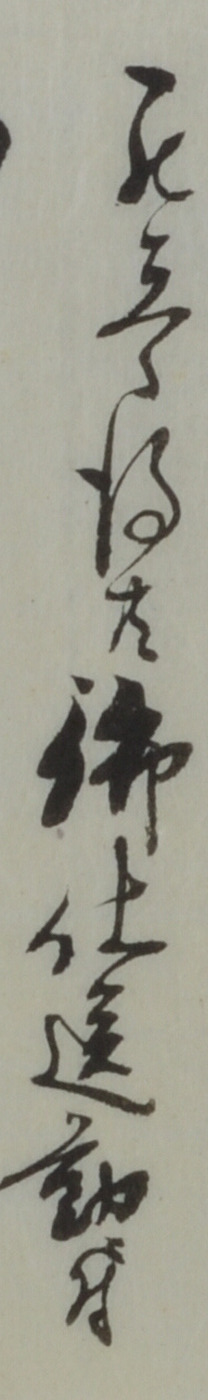罷在候得共御仕送勤ニ付
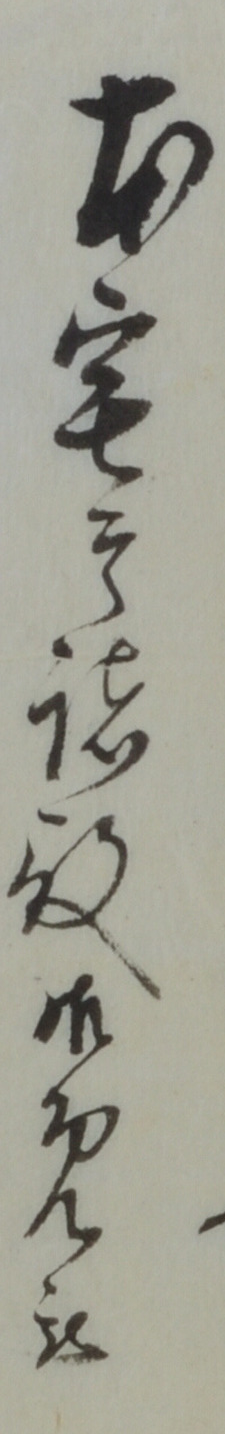本宅之諸役御免被
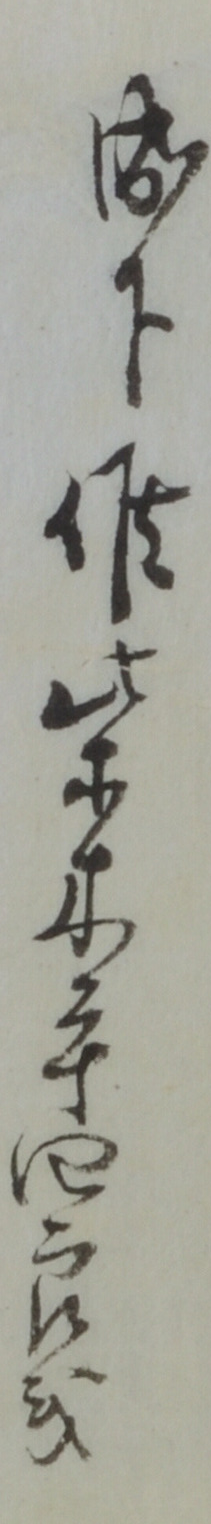成下候柴木平四郎義
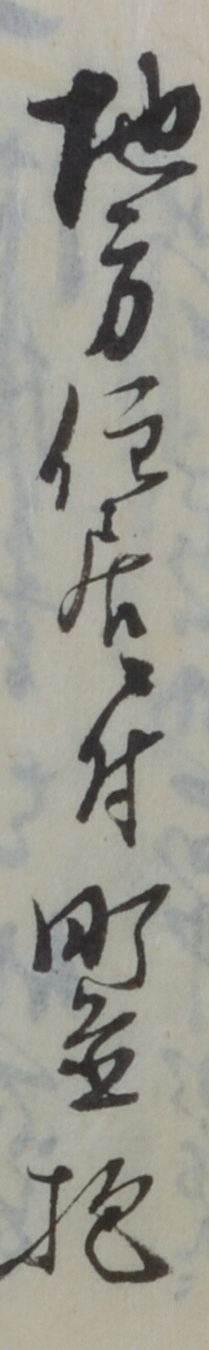地方住居ニ付町並抱
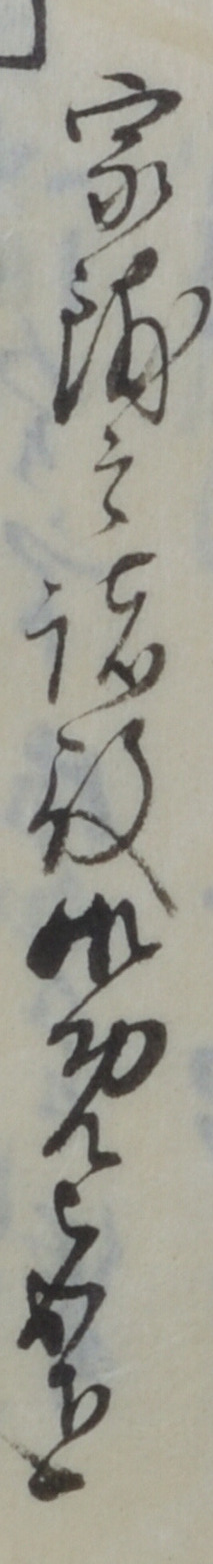家敷之諸役御免被成下候

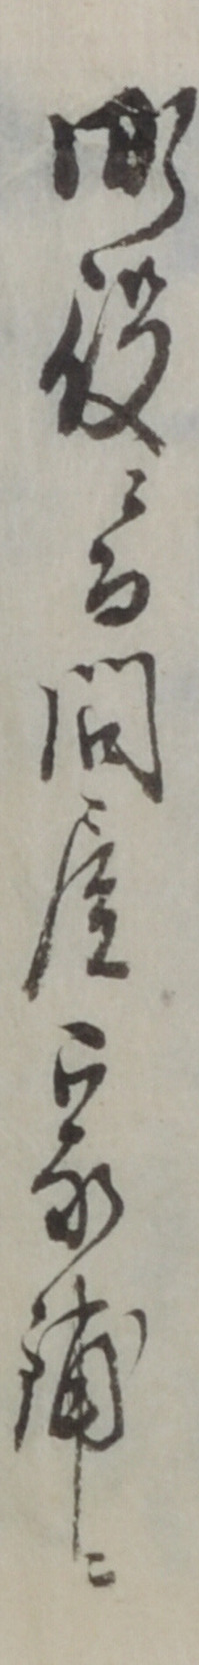町役ニ而問屋家敷ニ
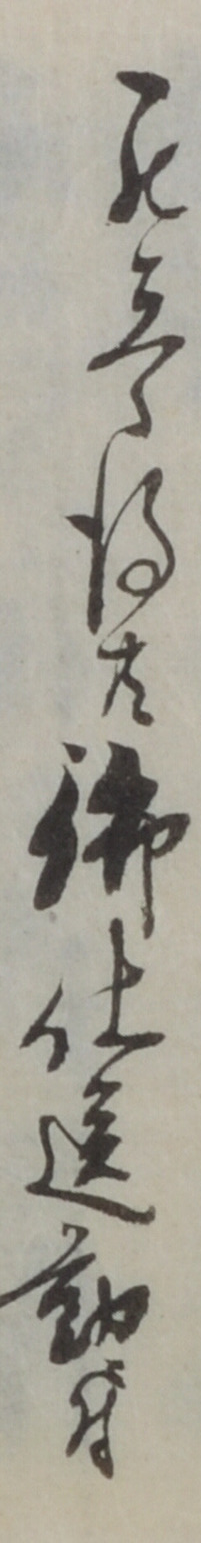罷在候得共御仕送勤ニ付
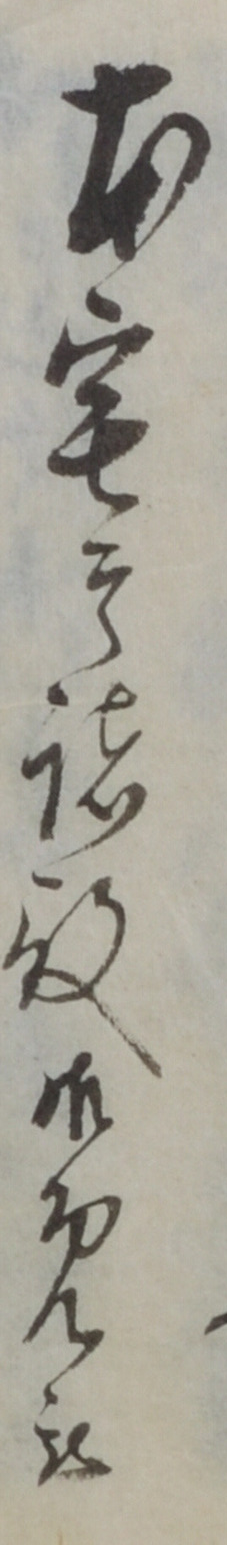本宅之諸役御免被
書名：抜書
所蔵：伊那市立高遠町図書館・合同会社AMANE
